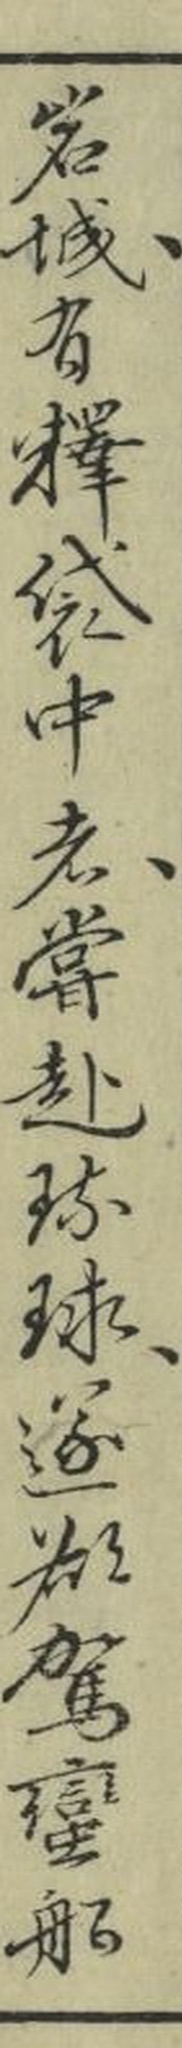岩城、有釈袋中者、嘗赴琉球、遂欲駕蛮船
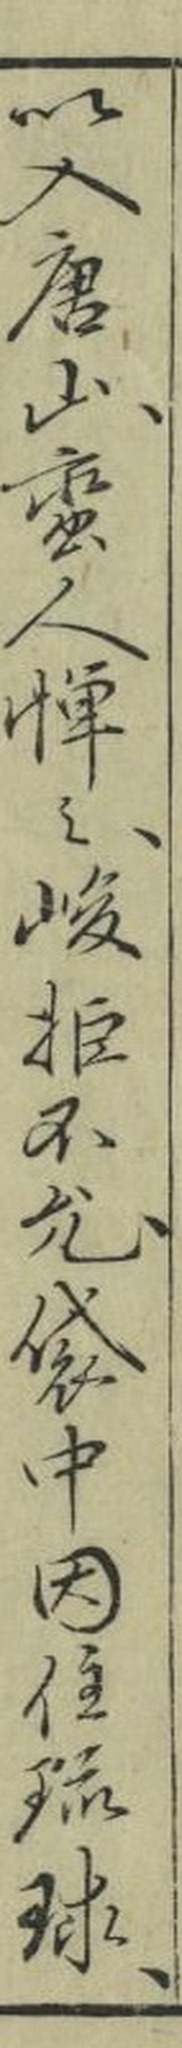以入唐山、蛮人憚之、峻拒不允、袋中因住琉球、
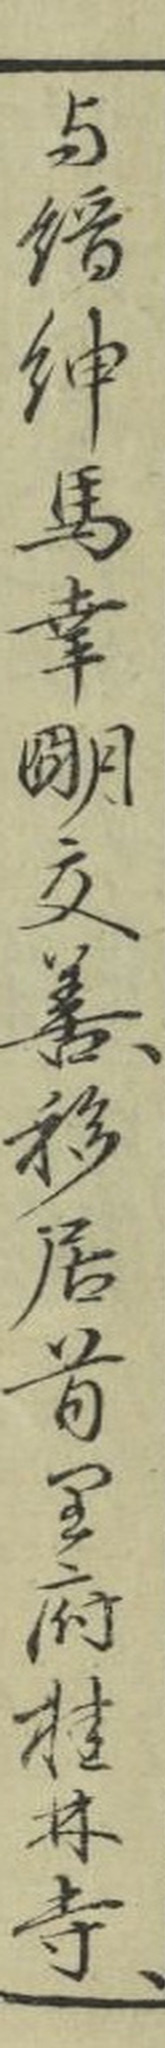与縉紳馬幸朙交善、移居首里府桂林寺、
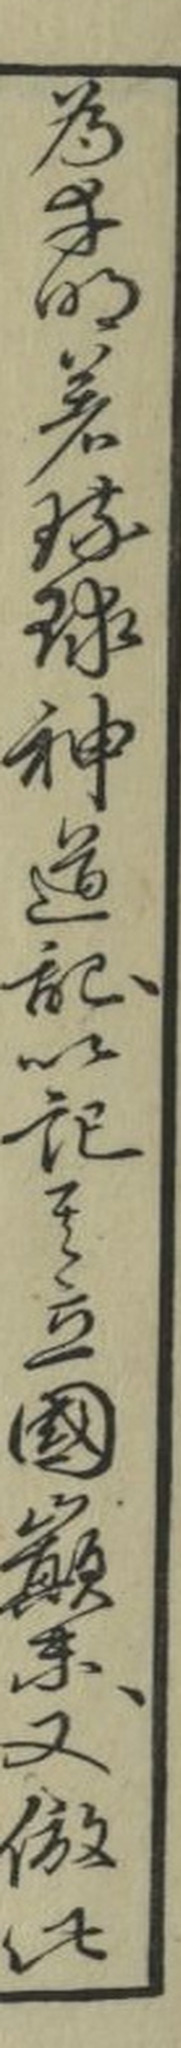為幸明著琉球神道記、以記其立国巔末、又倣此
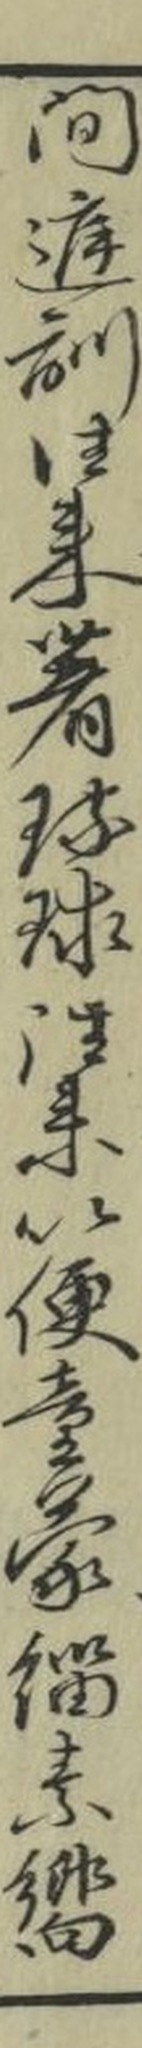間庭訓往来、著琉球往来、以便童蒙、緇素嚮
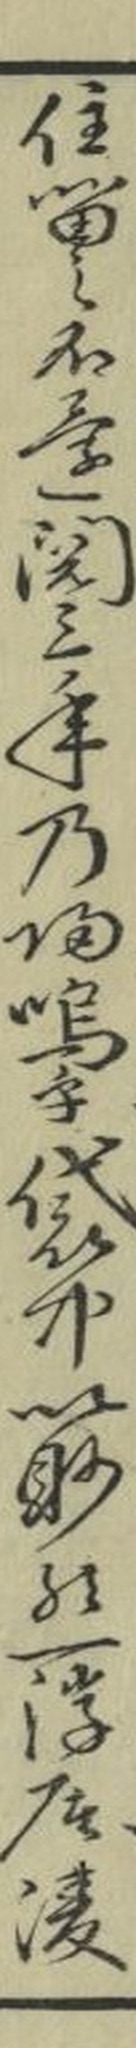往、留之不還、関三年乃帰、嗚乎、袋中以眇能一浮居、凌
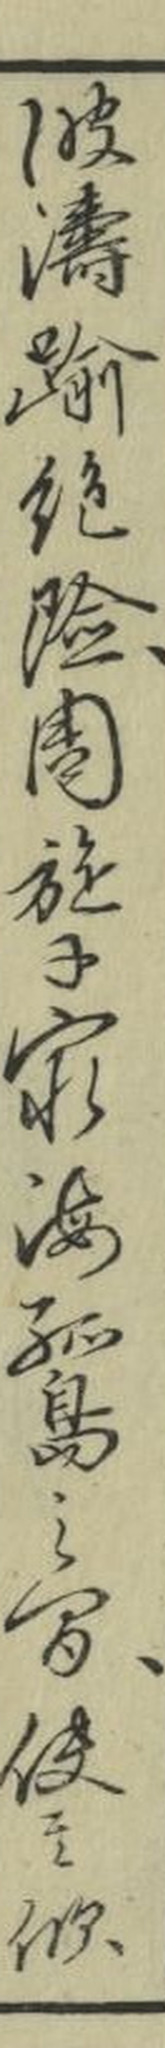波濤踰絶険、周旋于窮海孤島之間、使其欣
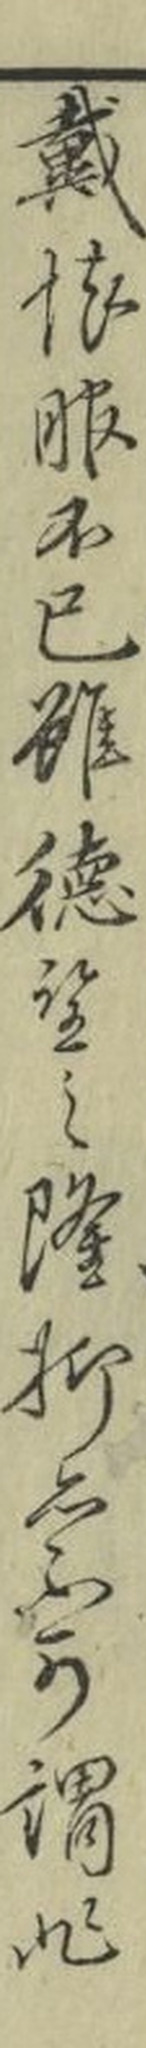戴依服不已、雖徳望之隆、抑亦不可謂非
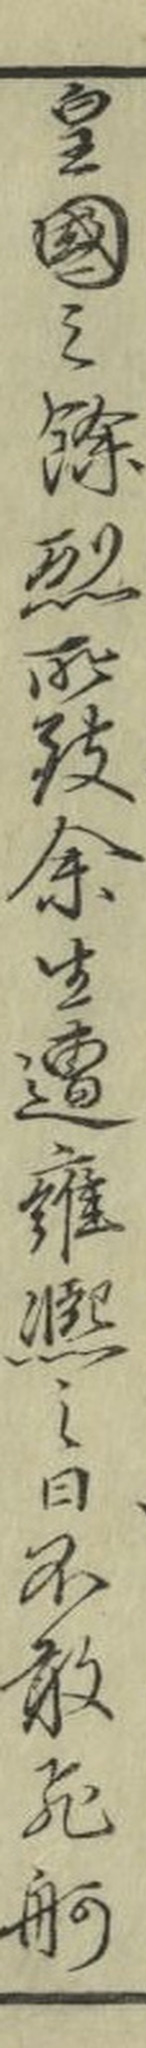皇国之余烈所致、余生遭雍煕之曰、不敢飛舸
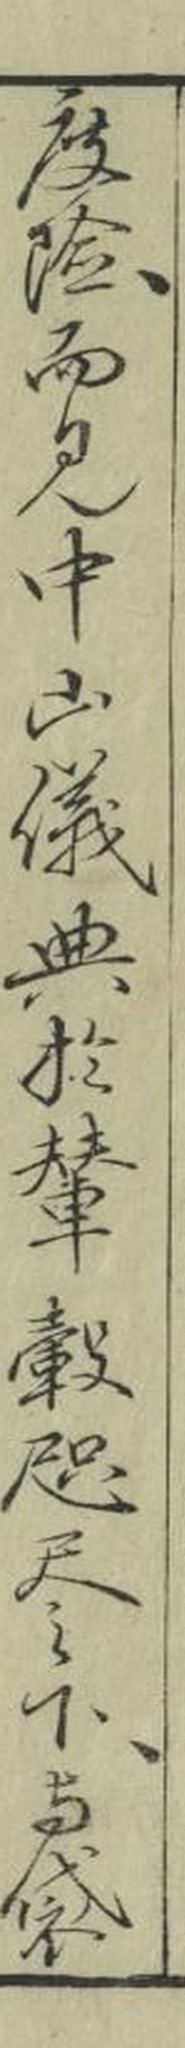度険、而見中山儀典於輦轂咫尺之下、与袋
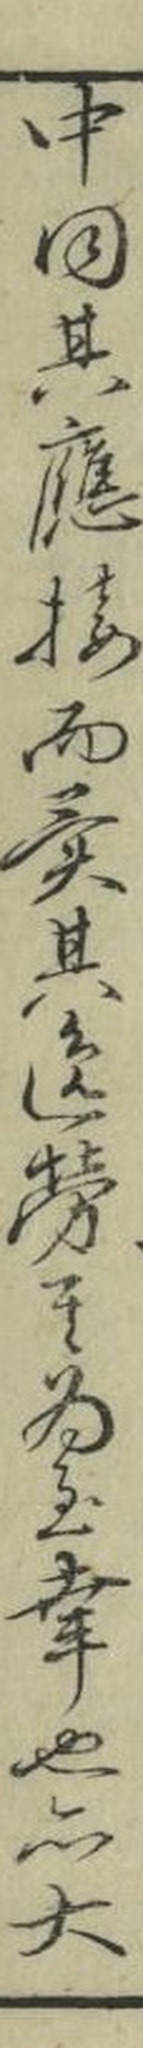中同其応接、而異其逸労、其為至幸也亦大

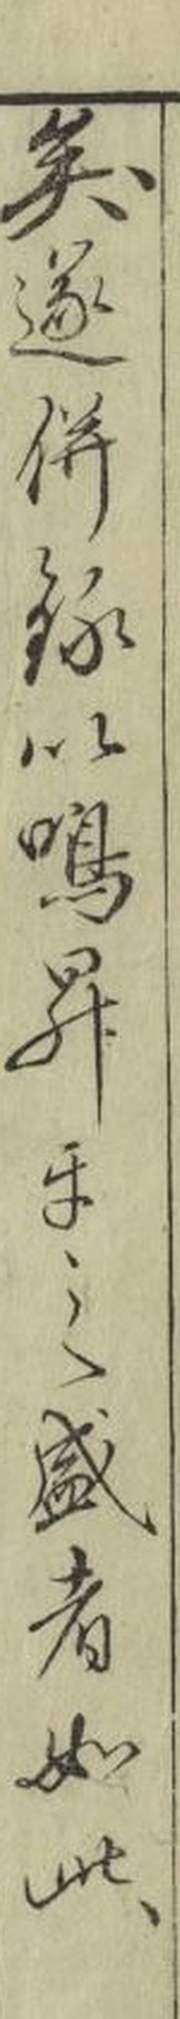矣、遂併録以鳴昇平之盛者如此、
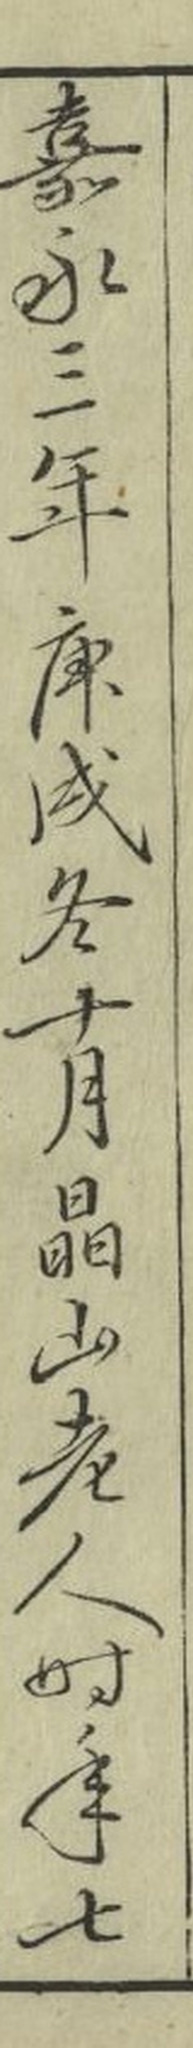嘉永三年庚戌冬十月晶山老人時年七
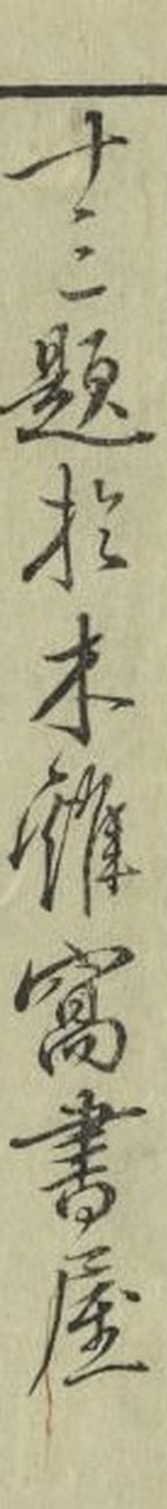十三題於木雞窩書屋
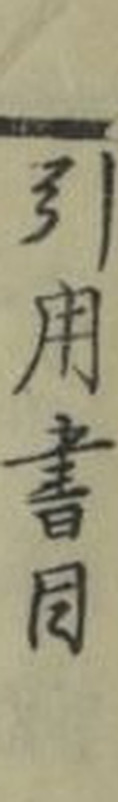引用書目
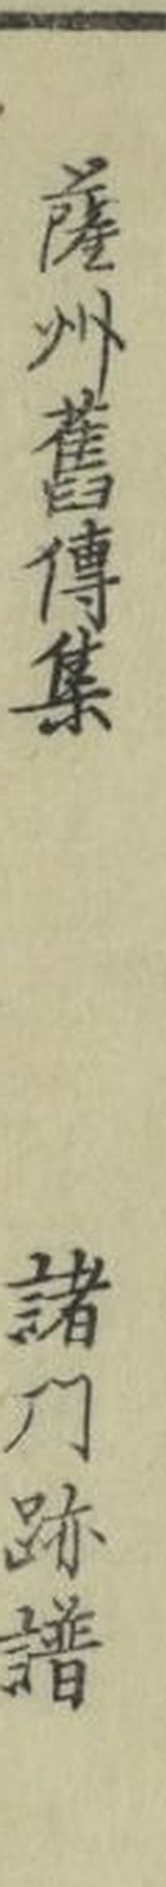薩州旧伝集諸国跡譜
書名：琉球入貢紀略
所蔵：University of the Ryukyus Library
